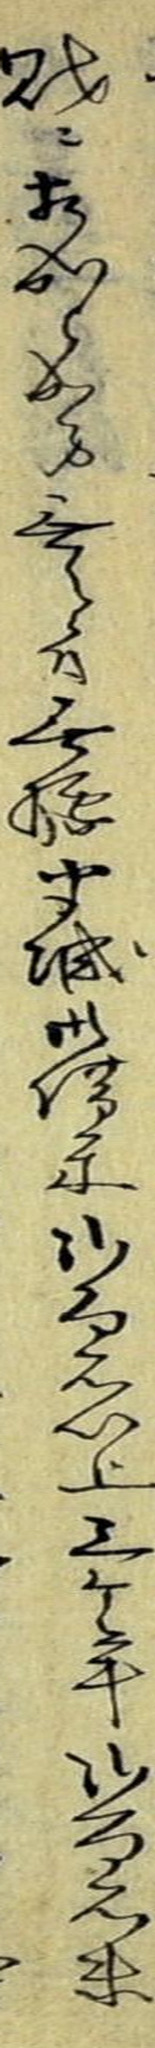財に相成被成方無之候に付無拠半減御借米弐百石以上三ヶ年二百石未
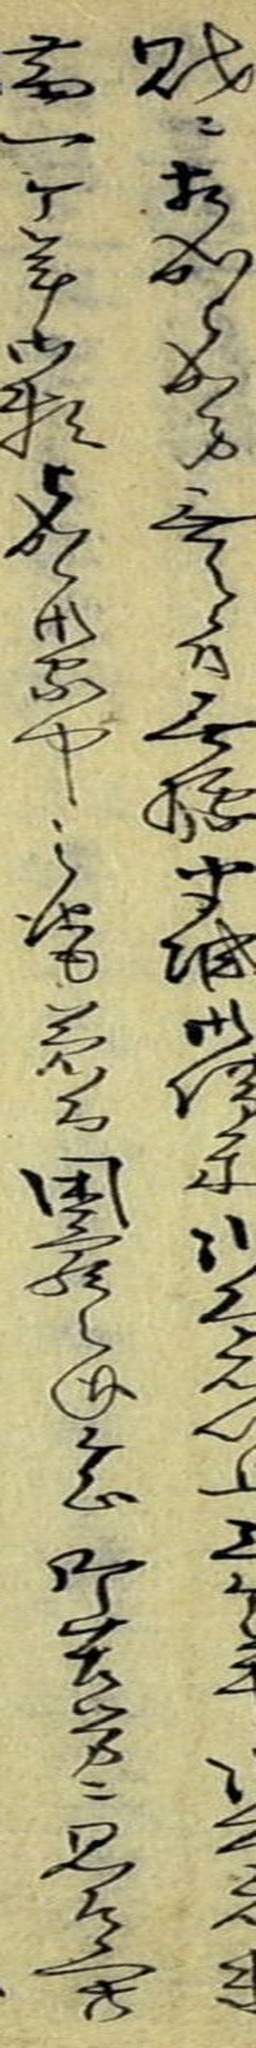満一ケ年御頼被成候御家中之儀も兼而困窮之趣甚御苦労に思召候へ共
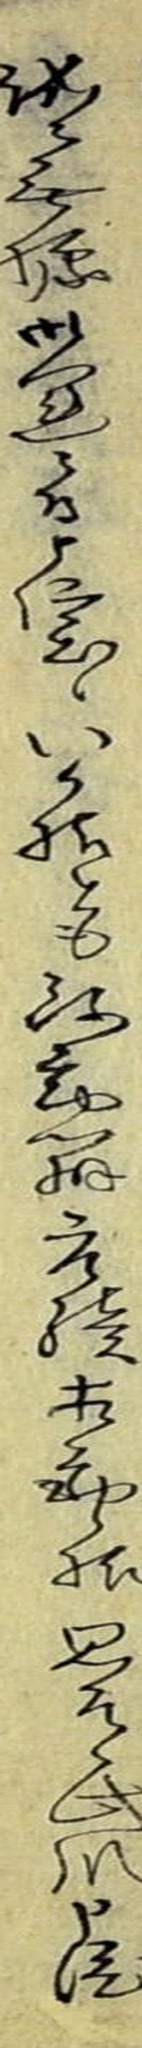誠に無拠御運に付被仰出候いか様とも致勘弁取続相勤候様思召候此段申渡
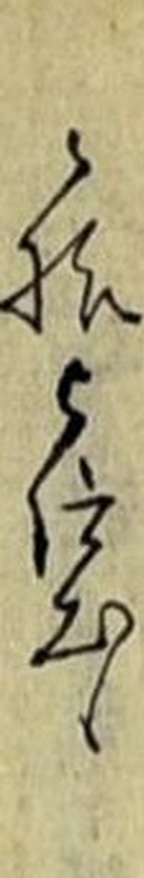候様被仰出候
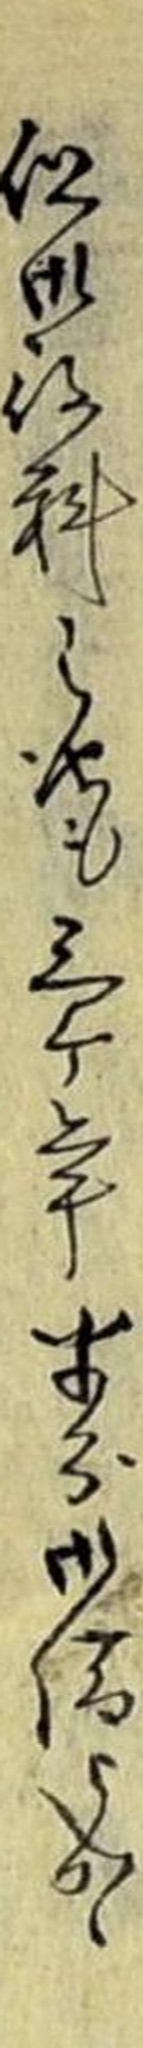但御役料之儀も三ヶ年半分御借被成候
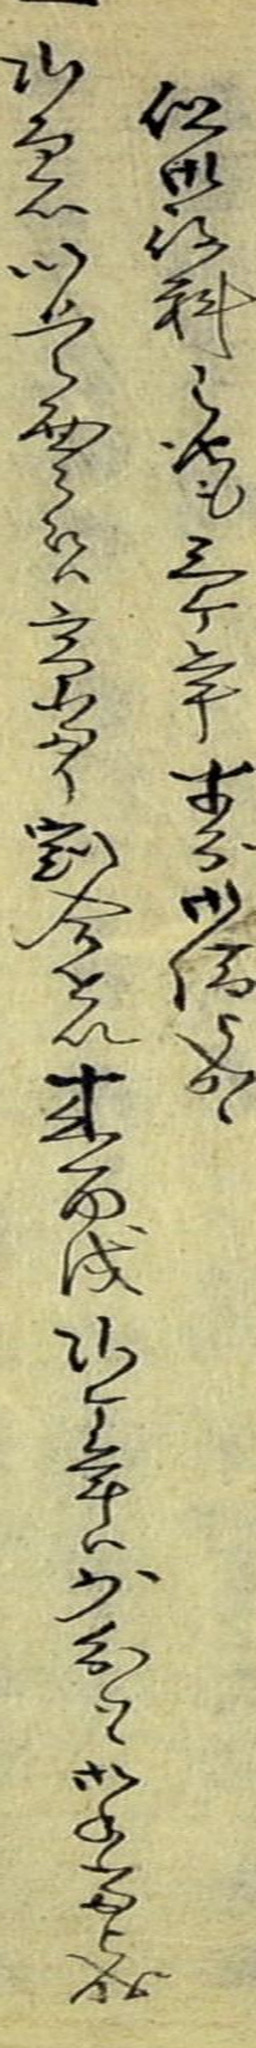一弐百石以上之面々江は高当り割合を以來酉戌弐ヶ年は少分つヽ御手当被成
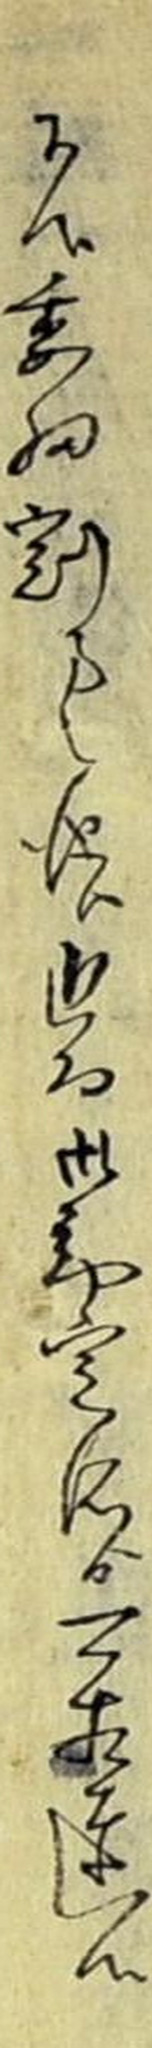下候委細割方之儀は追而御勘定所ゟ可相達候
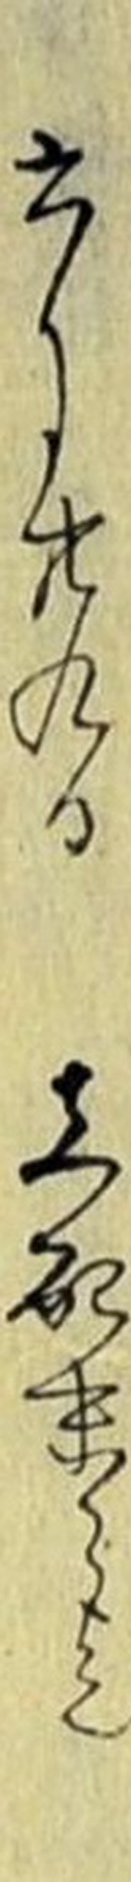六月廿九日支配末々迄

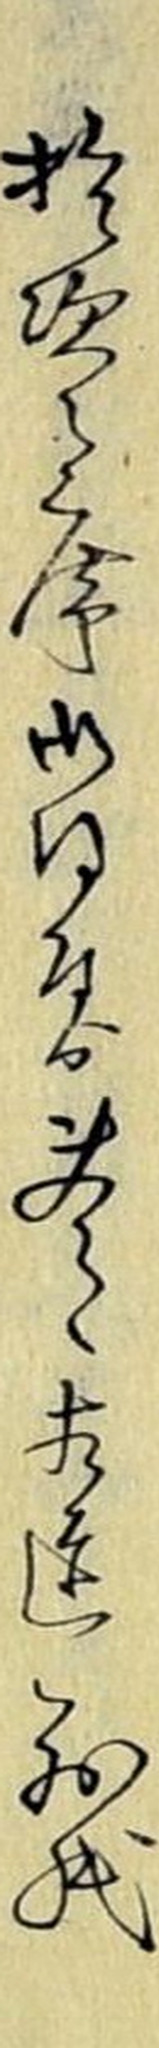於次之席御目付ゟ夫々へ相達別紙
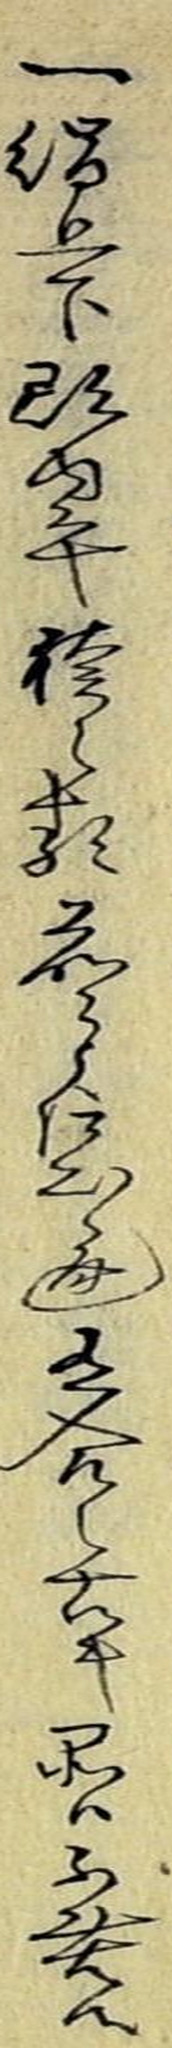一絹上下郡内平袴之類度々被仰出候通有合之古キ品は不苦候
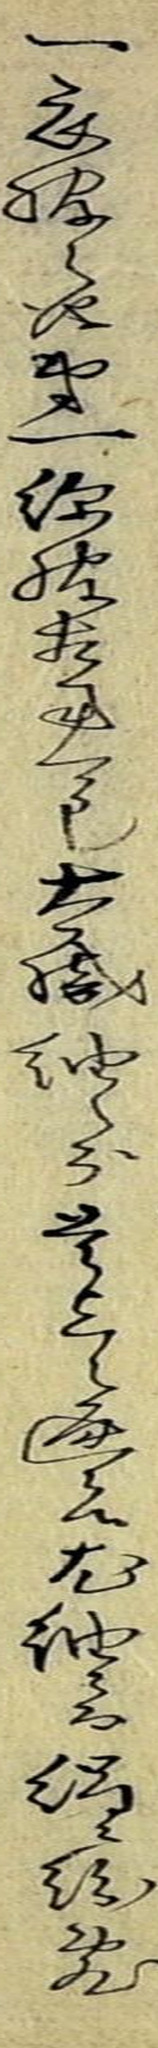一衣服之儀第一綿服相用可申候太織紬之分是迄之通に候尤紬に而絹に紛敷
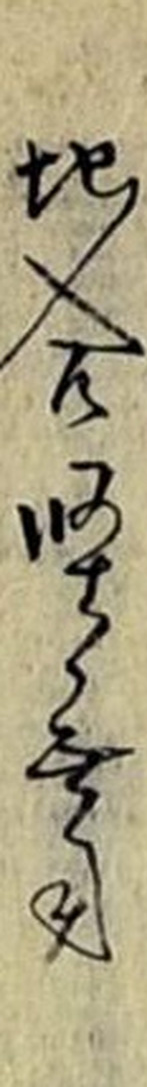地合堅無用
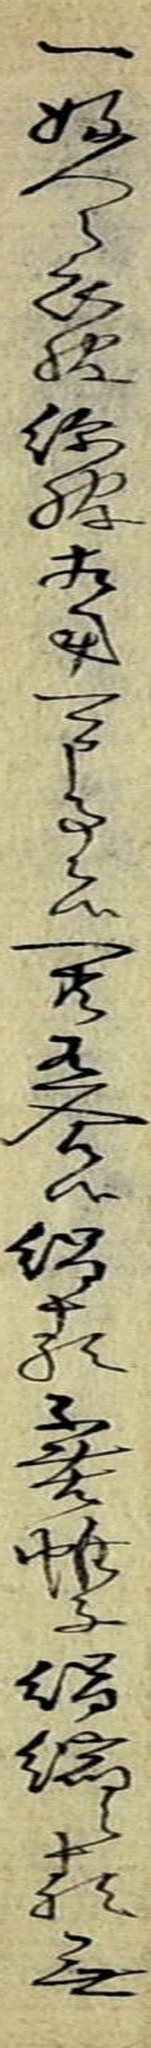一婦人之衣服綿服相用可申事に候へ共有合候絹類不苦帷子絹縮之類無
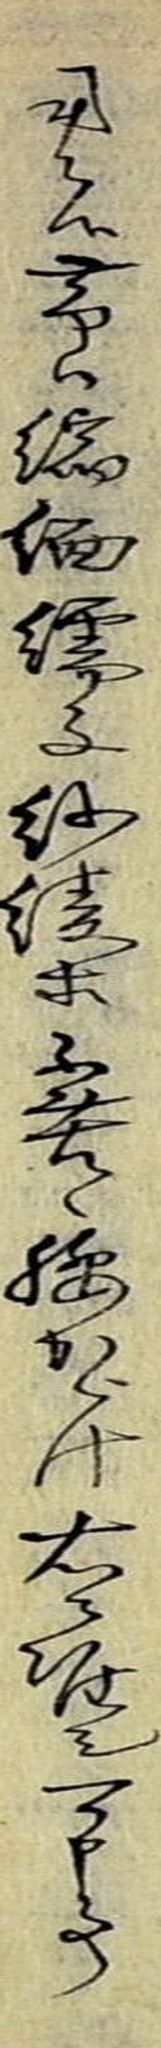用に候帯は縮緬綸子紗綾等不苦候腰からけ右に准し可申事
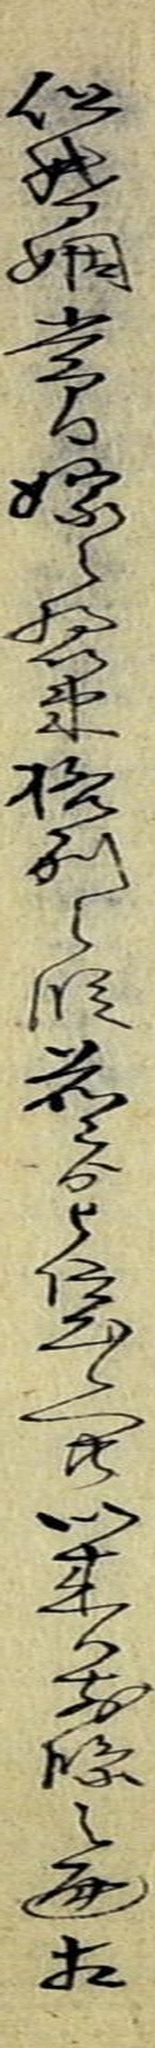但婚姻当日嫁之装束格別之段前々ゟ被仰出候へ共以来は前條之通相
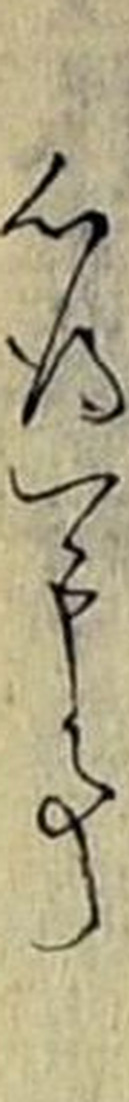心得可申事
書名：命令之部 四
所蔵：福井県文書館 Fukui Prefectural Archives
